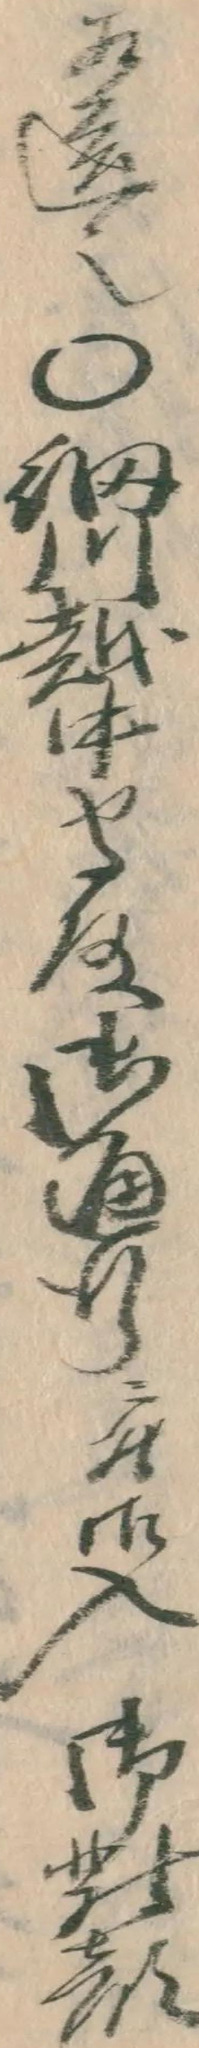相違之○細川越中守殿御通行に付御入御對顔
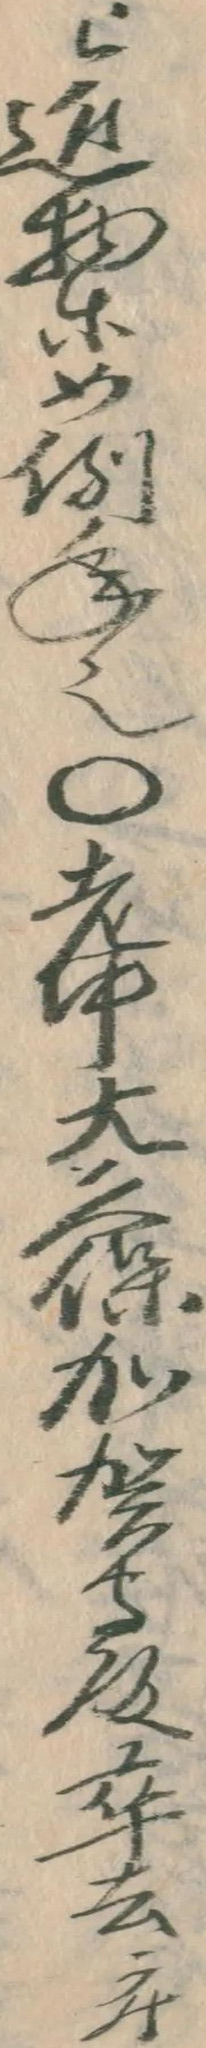被進物等如例年也○老中大久保加賀守殿卒去ニ付
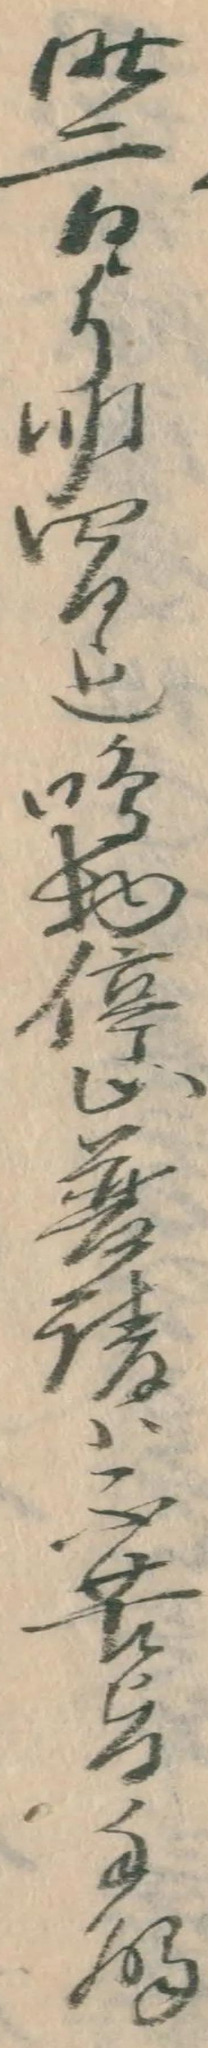昨二日より明四日迄鳴物停止普請ハ不苦旨手觸
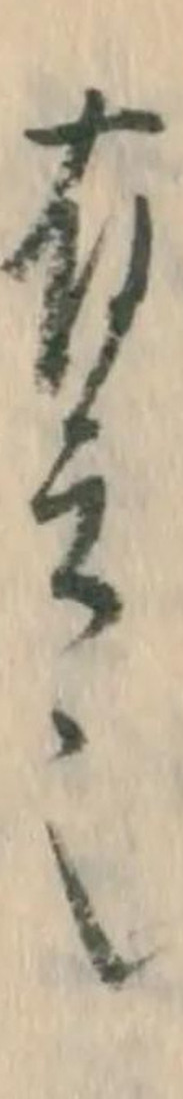有之也
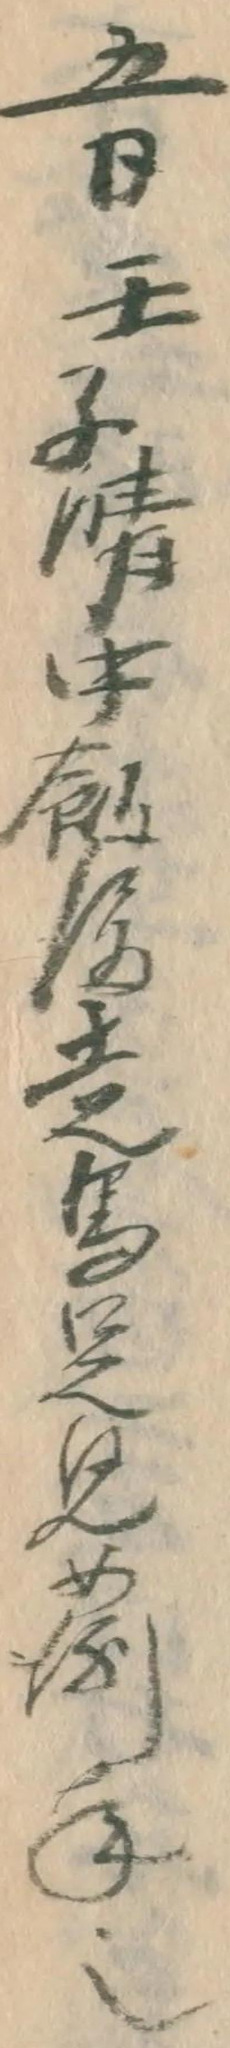五日壬子晴中飯後走馬足見如例年也

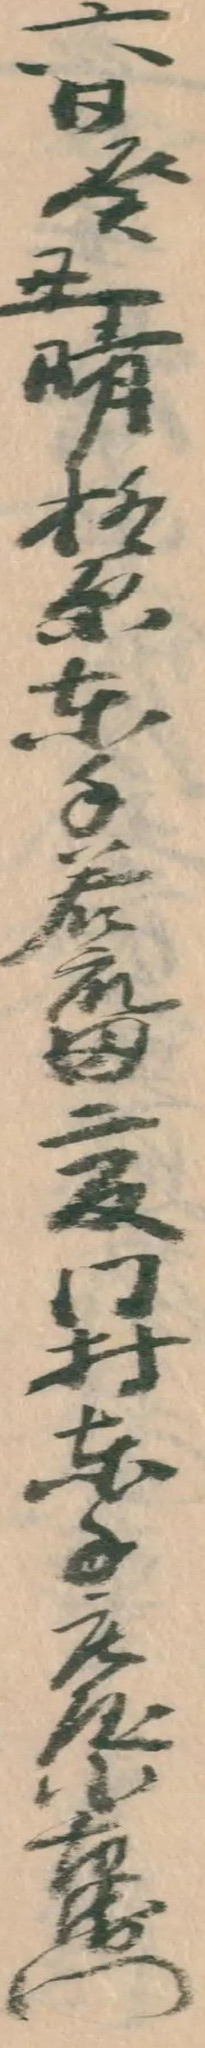六日癸丑十晴柊原東手若衆田二反同村東手庄屋小左衛門
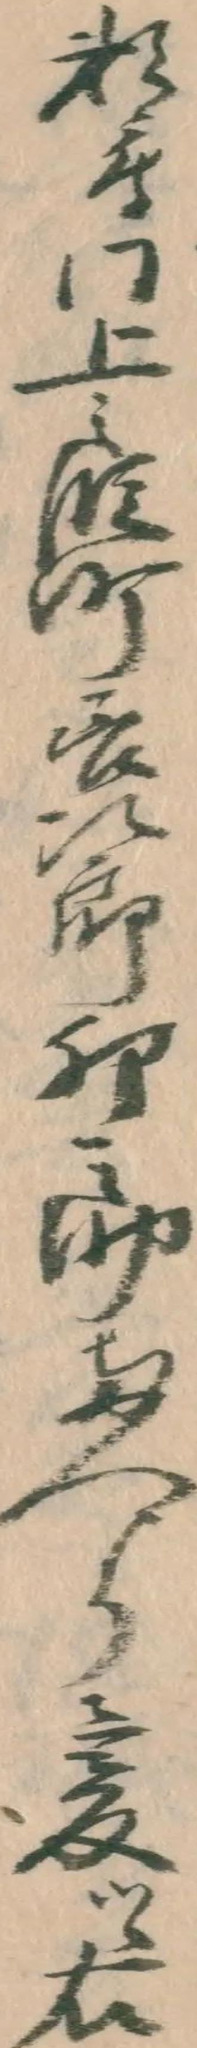頼ニ付同上之段町善次郎卯之助両人より壱反ツヽ右
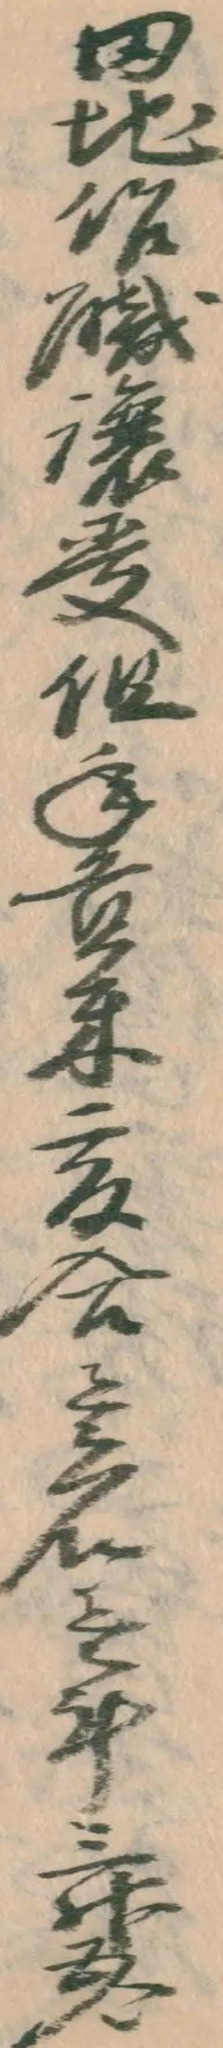田地作職譲受但年貢米二反合壱石壱斗三升五合
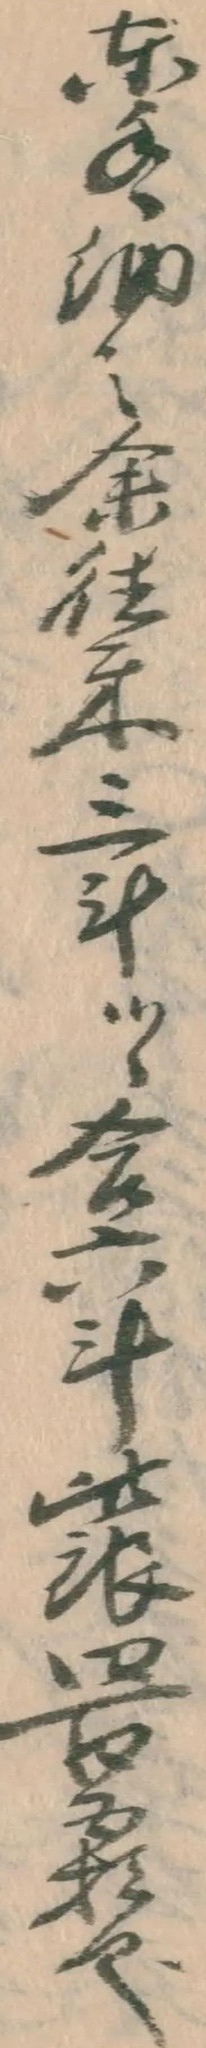東手ヘ納之余往米三斗ツヽ合六斗此銀四百五拾匁
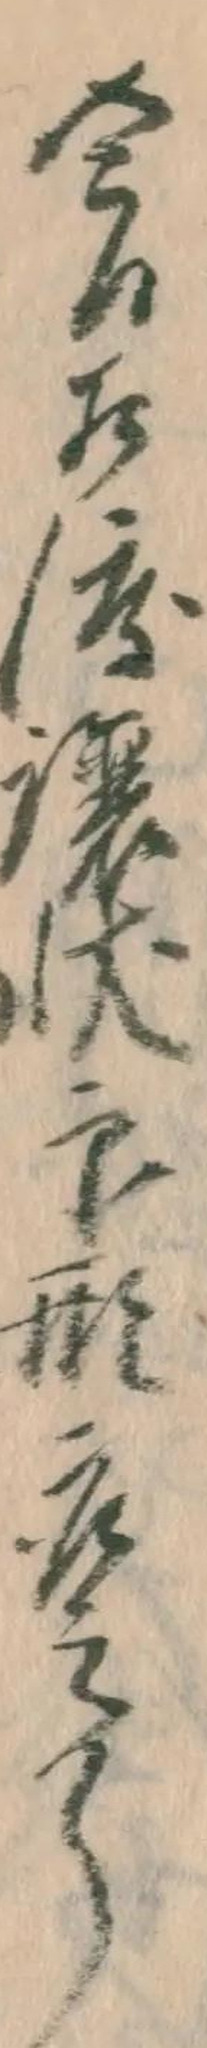今日相渡譲代印形取之了
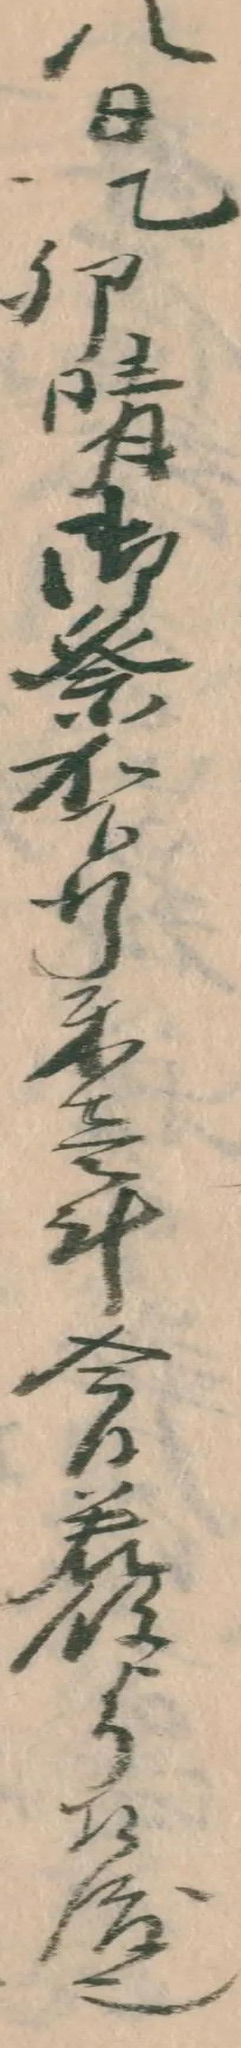八日乙卯晴御祭加下行米壱斗今日若役より相渡也
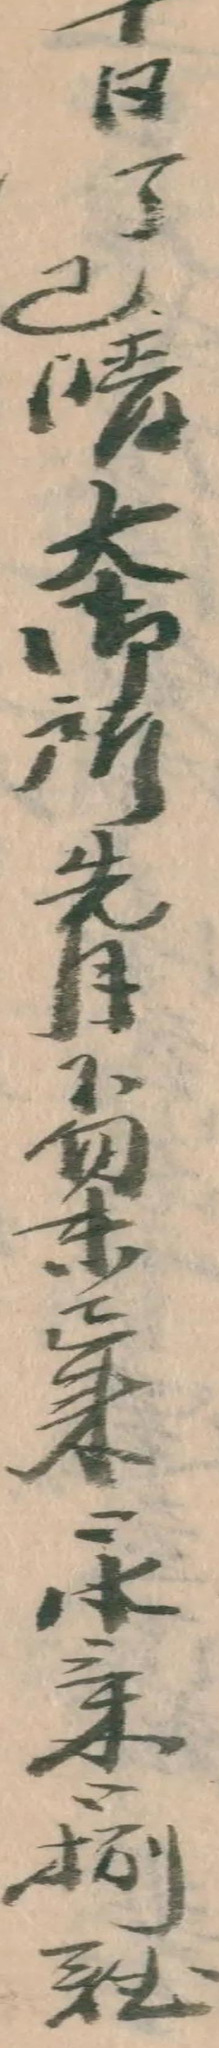十日丁巳晴大御所先月下旬末已来御水三木御捌難
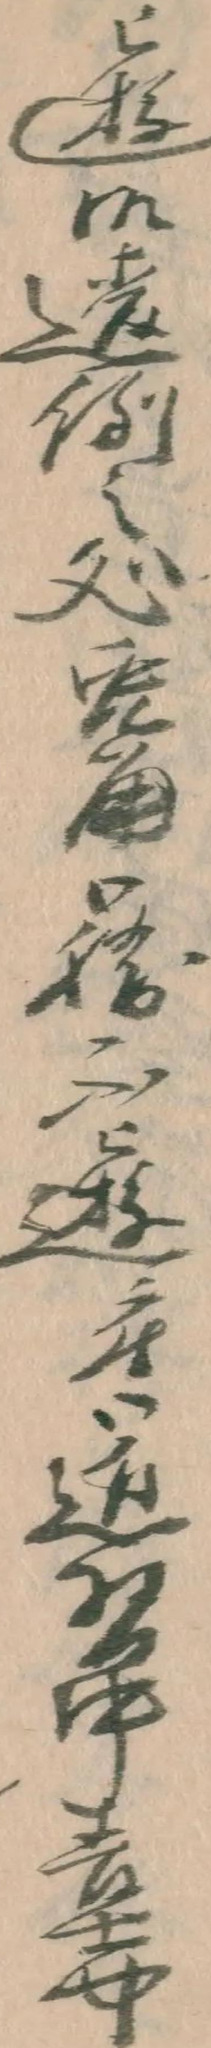被遊御遺例之処兎角御勝不被遊ニ付御近習中墓中
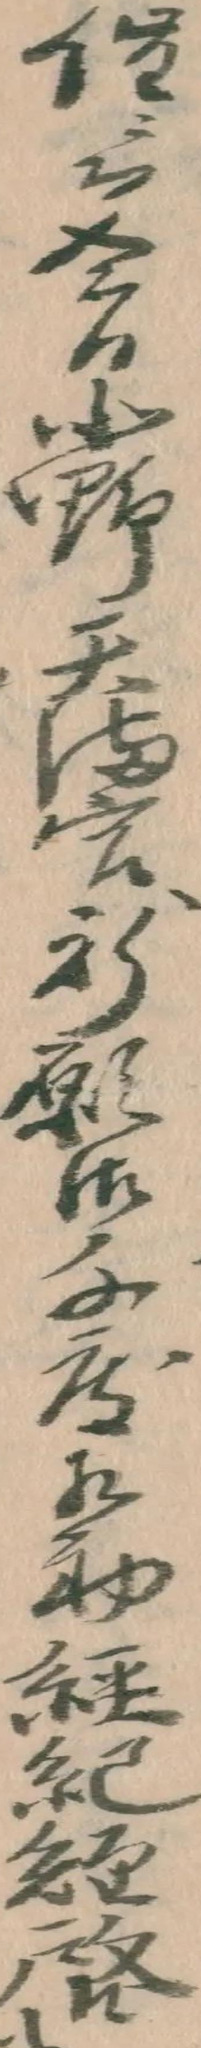催ニ而今日北野天満宮祈願御千度相勤経紀経啓も
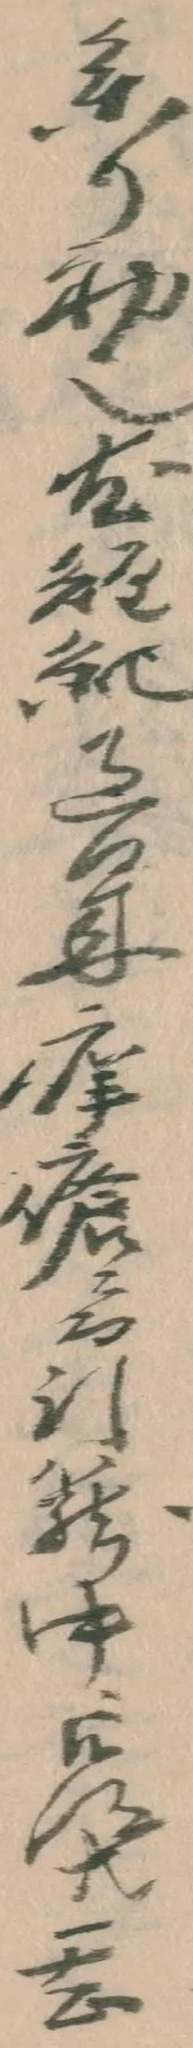参り初也尤経紀過日来痒瘡ニ而引籠中ニ候得共甚
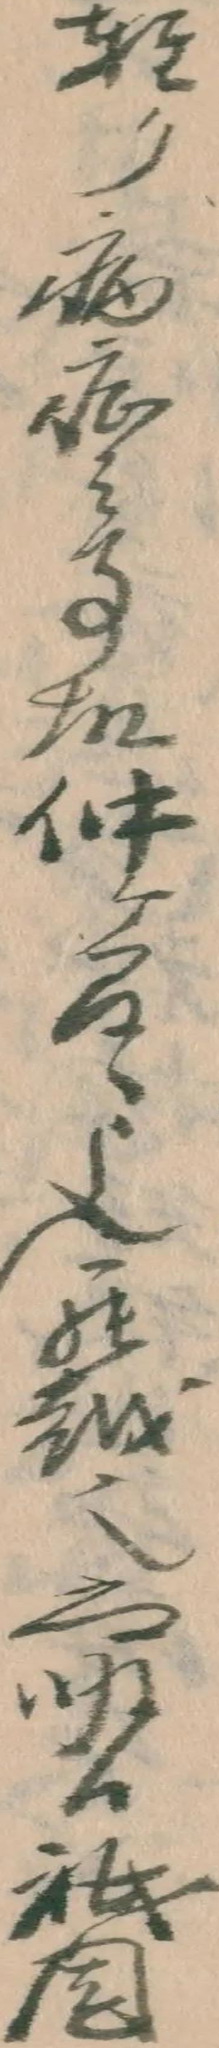軽ク病症之事故仲ヶ間へ申入罷越也尚明日祇園
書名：賀茂社記録. 第67冊
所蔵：国立国会図書館 National Diet Library, JAPAN
